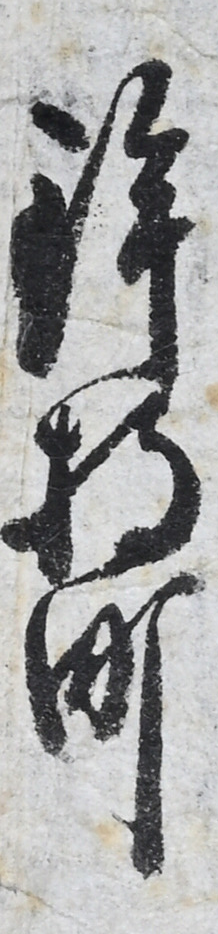鉾持町
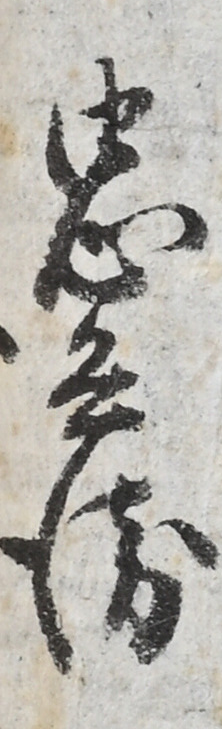忠兵衛
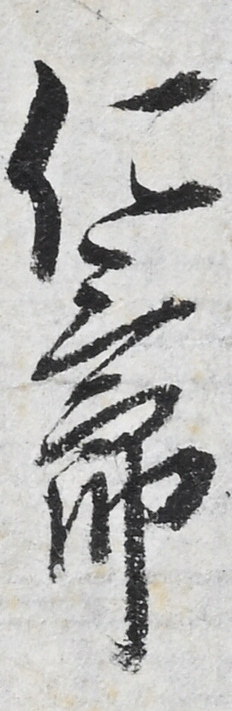仁三郎
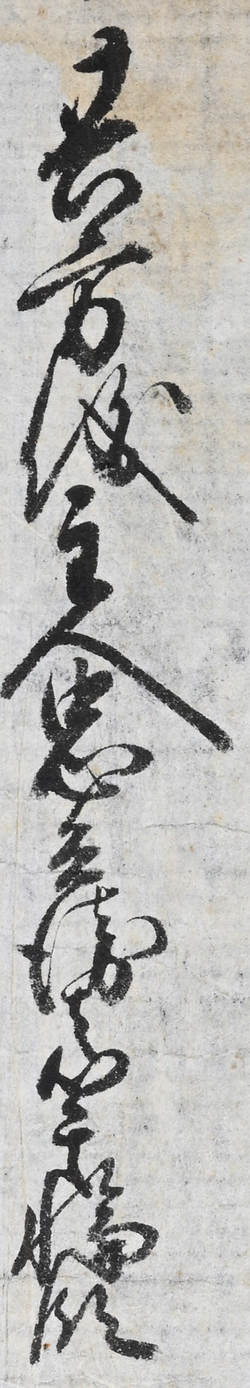其方義主人忠兵衛者箕輪領
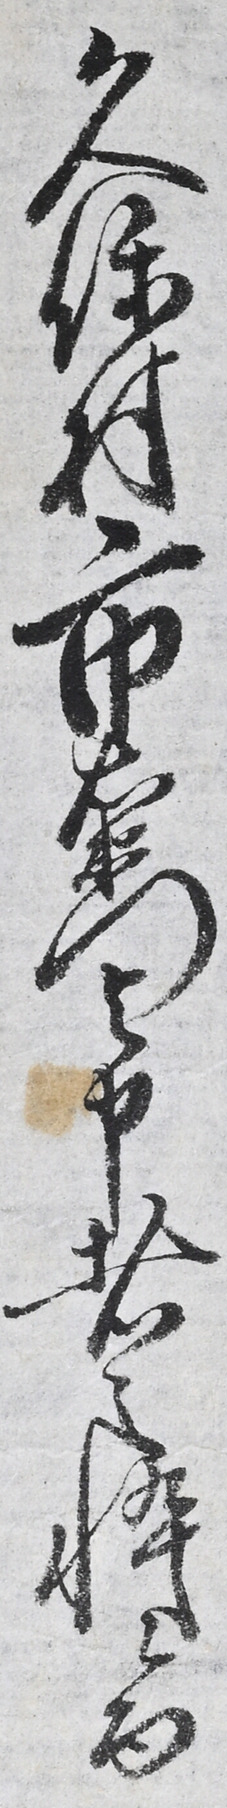久保村市右衛門与申者之悴ニ而
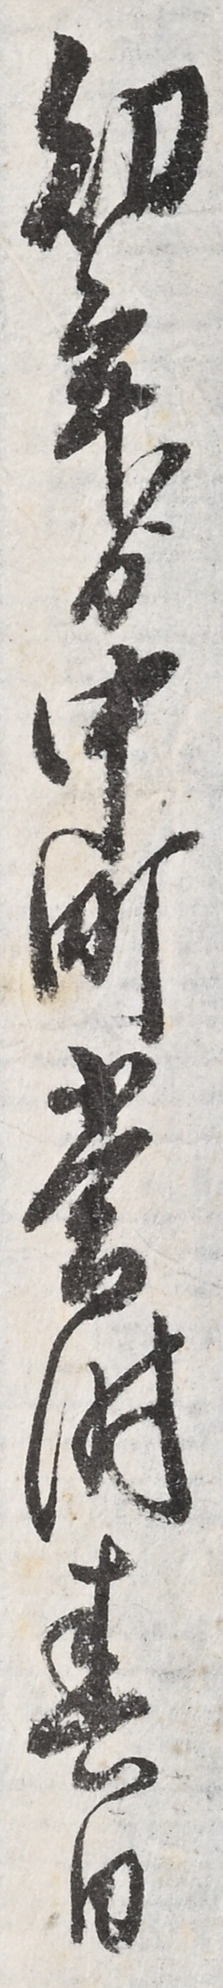幼年より中町当時春日
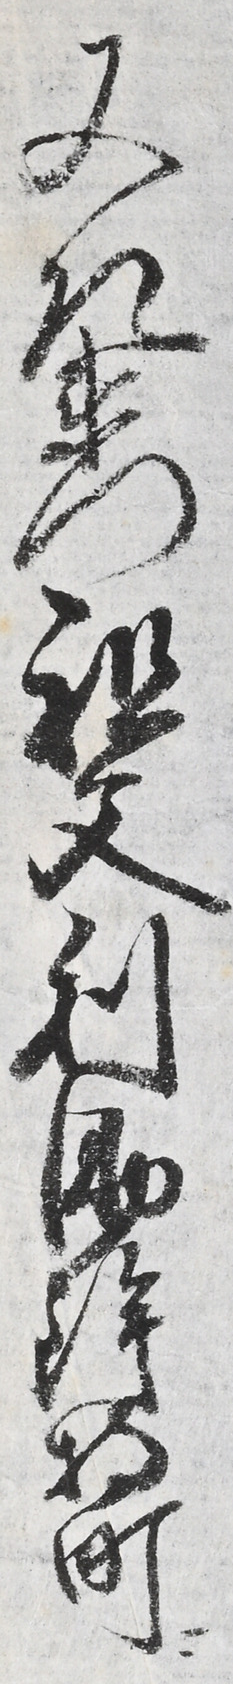又左衛門祖父利助鉾持町ニ
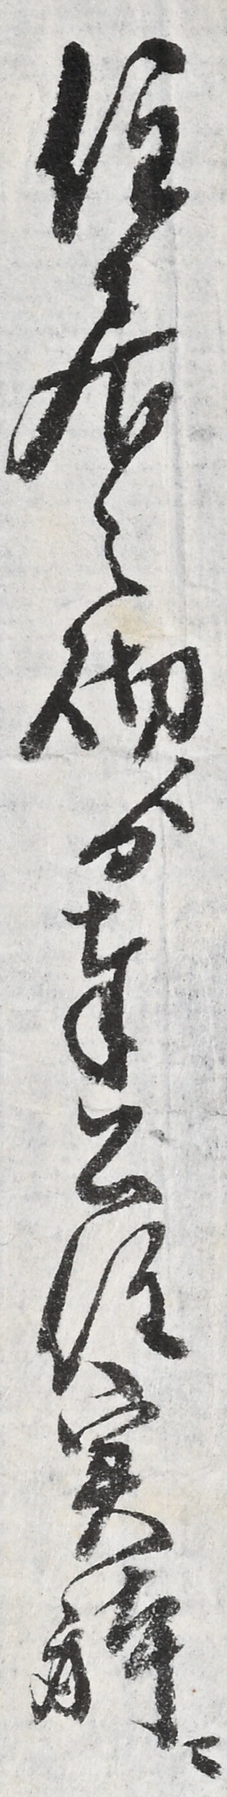住居之砌より奉公住実体ニ
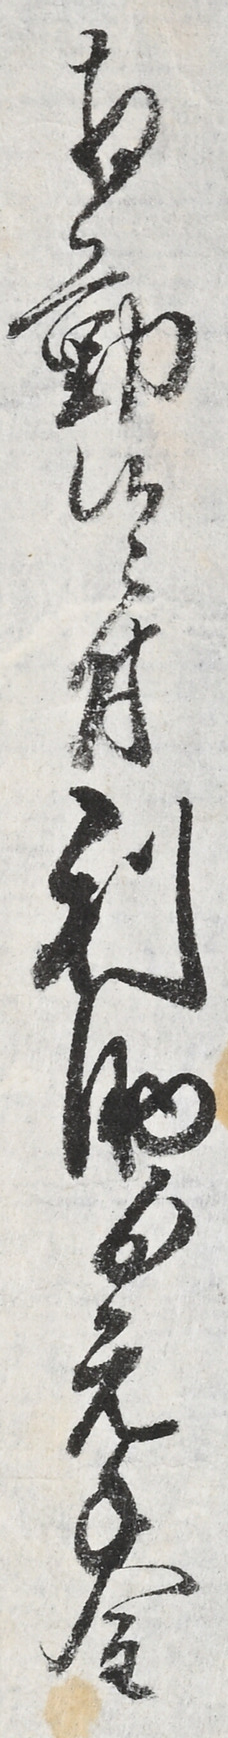相勤候ニ付利助より元手金
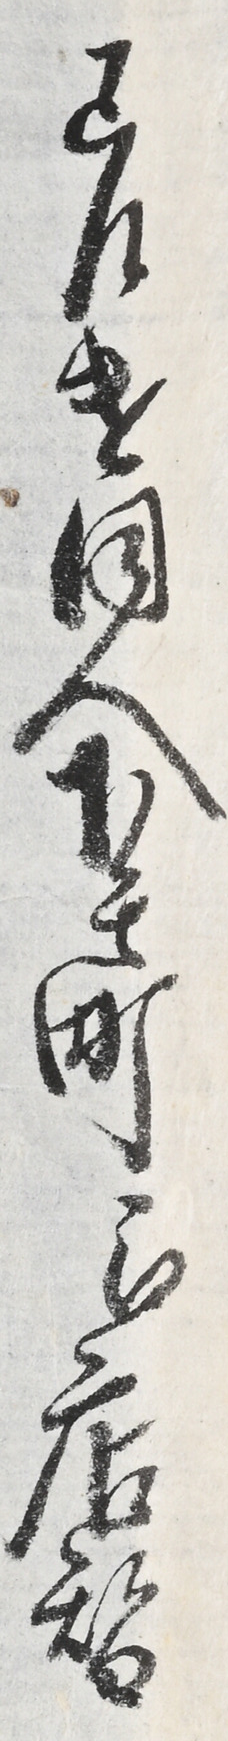差遣同人下町え店替
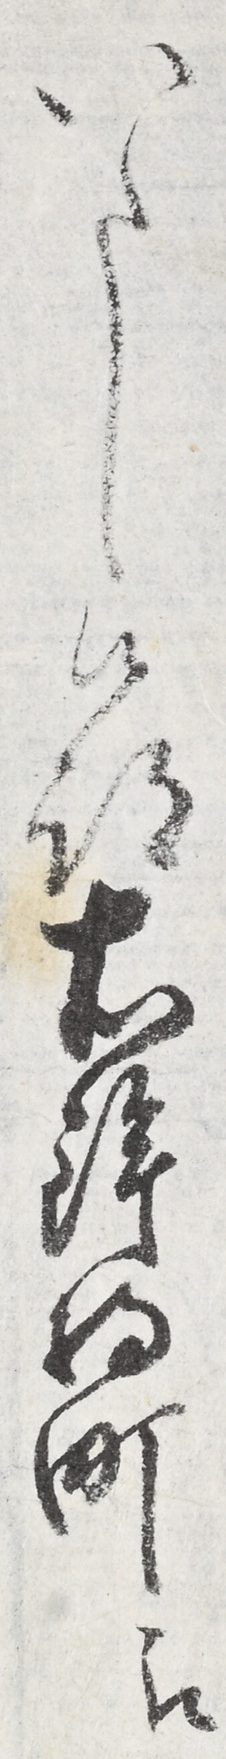いたし候跡右鉾持町え

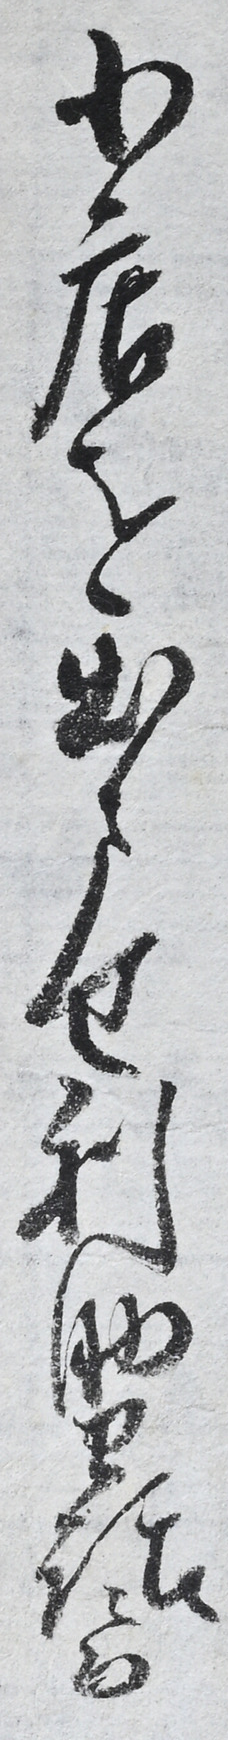小店を出させ利助セ話ニ而
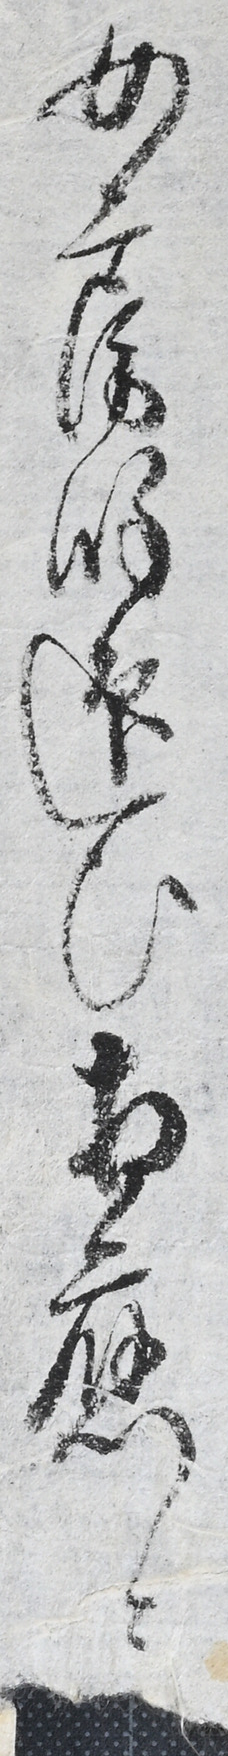女房呼迎ひ相応ニ
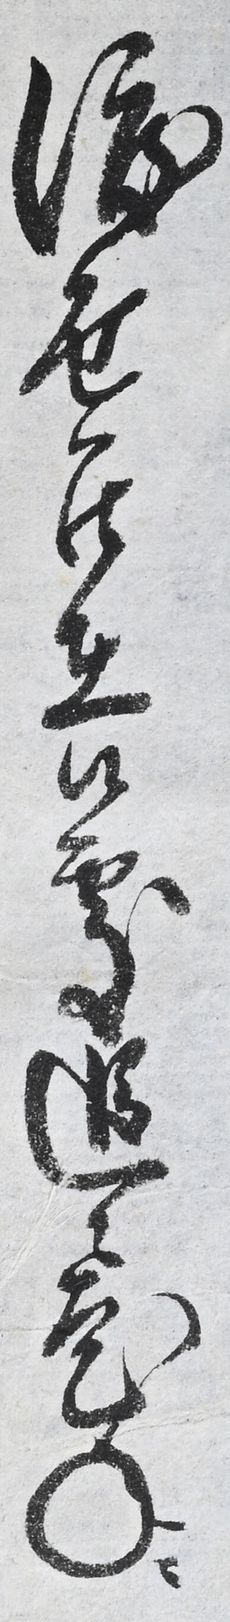渡世罷在候処追々老年ニ
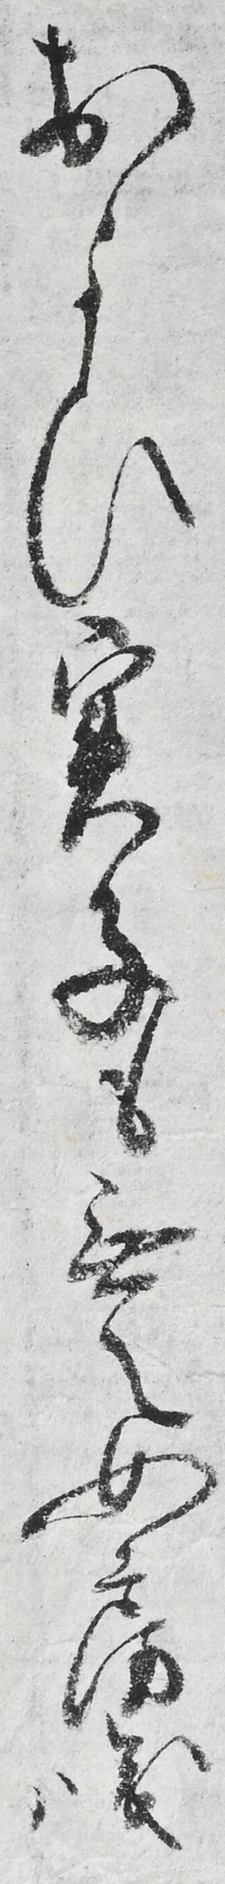およひ実子も無之女房義ハ
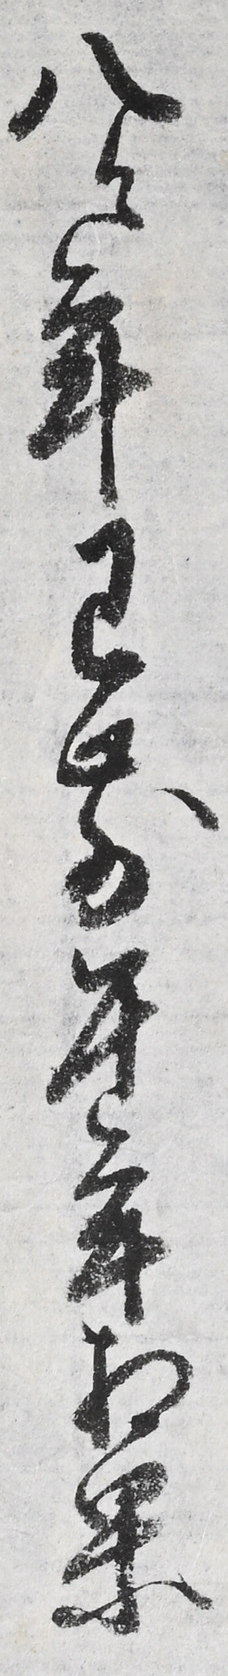八ヶ年已前午年相果
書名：（書付）
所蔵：伊那市立高遠町図書館・合同会社AMANE
